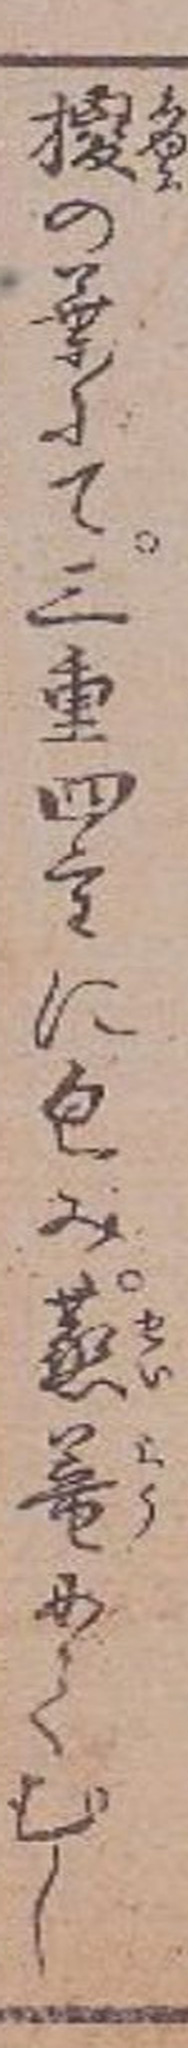椶の葉にて。三重四重に包み。蒸駕篭にてむし

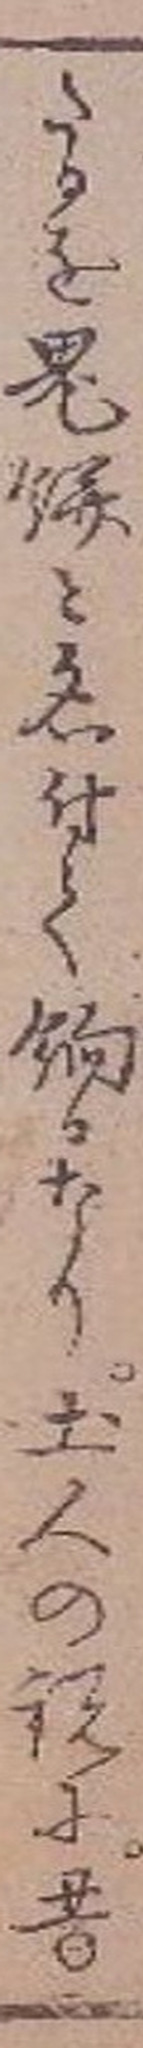たるを鬼餅と名付て餉るなり。土人の祝に。昔
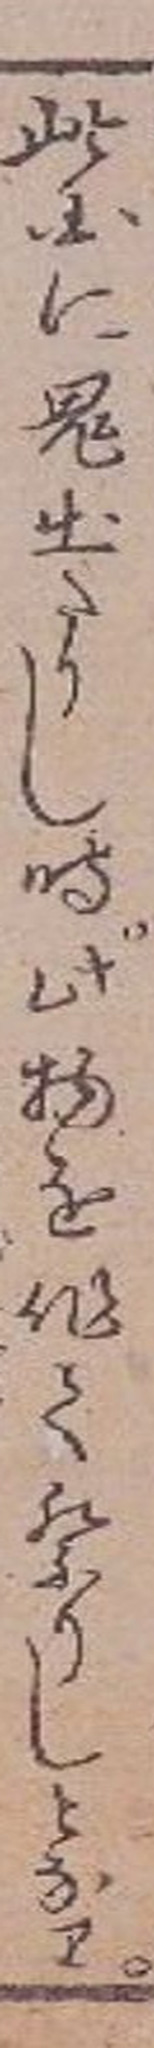此国に鬼出たりし時。此物を作て祭りしとなり。
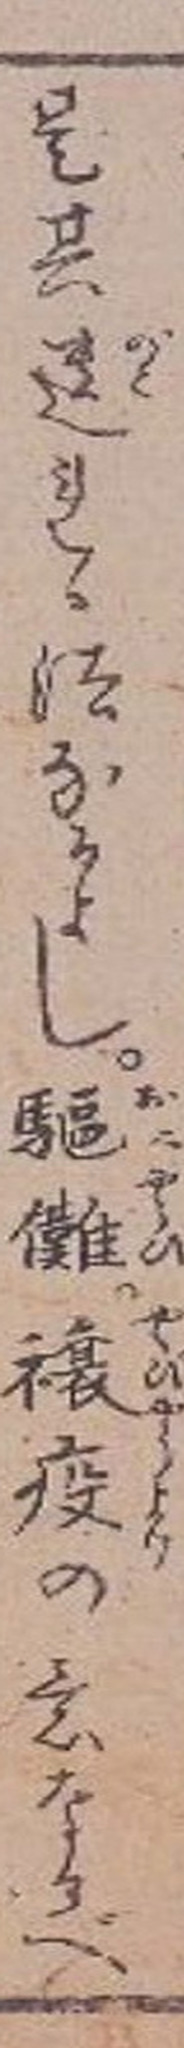是其遺れる法なるよし。駆儺。禳疫の意なるべ
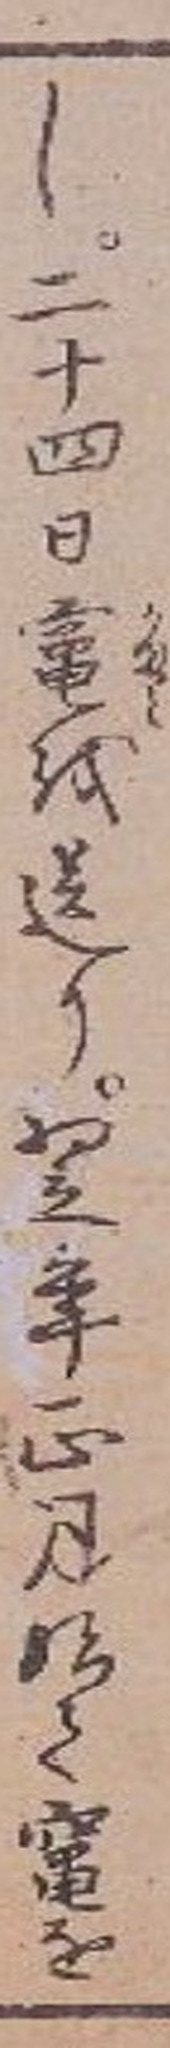し二十四日竈を送り。翌年正月始て
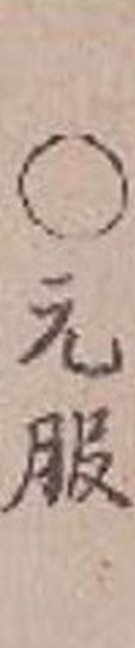〇元服
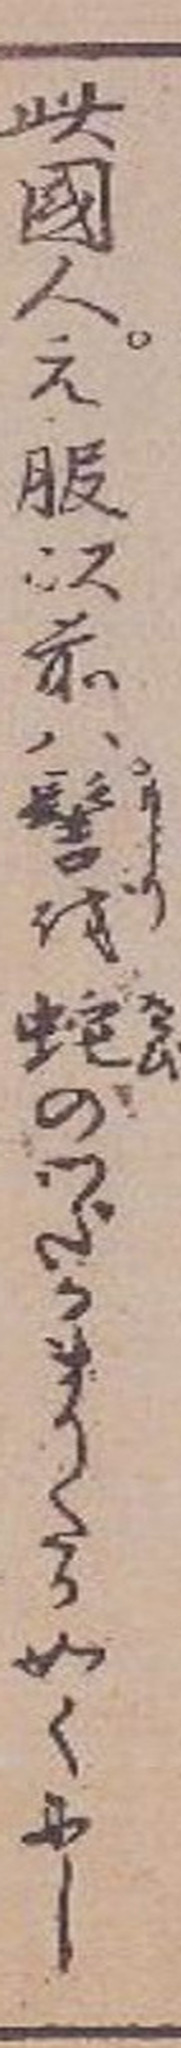此国人。元服以前は髻を蛇のわたかまりたる如くにし
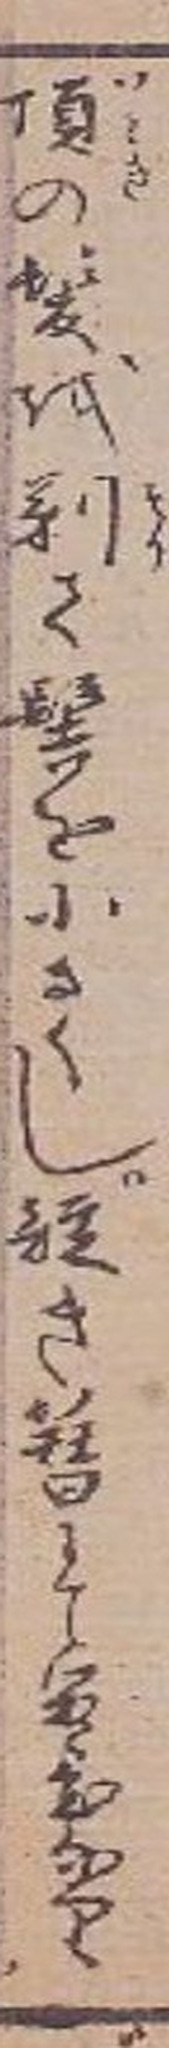額の髪を剃て髻を小さくし。短き簪にて留置なり
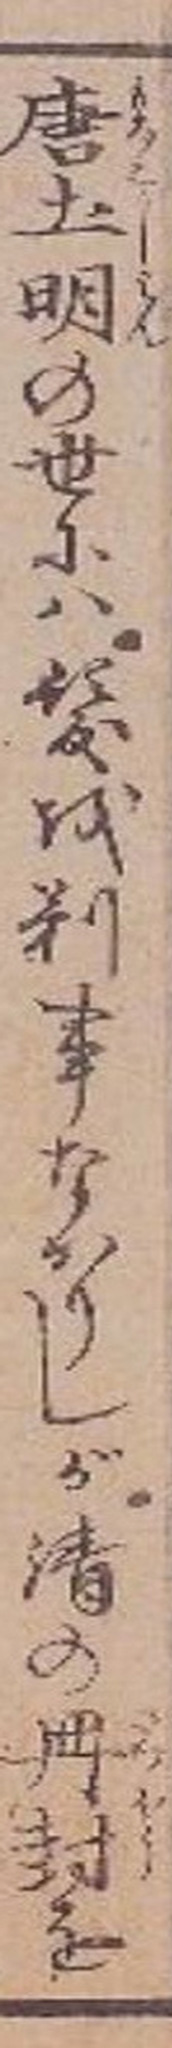唐土明の世にはには•髪を剃事なかりしが•清の冊封を
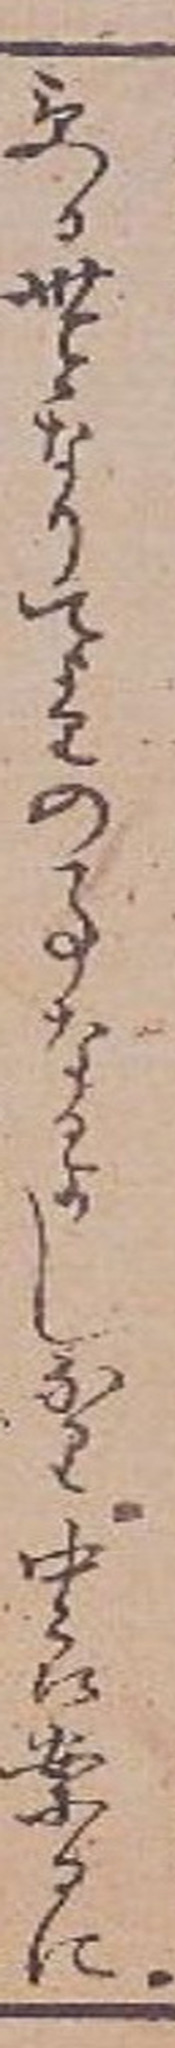受る世となりてよりの事なるよしなり•中々に案るに•
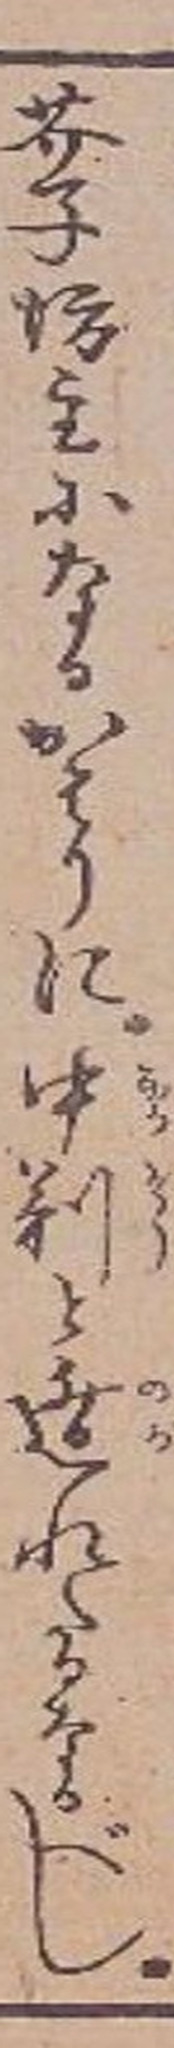芥子坊主になるかはりに•中剃と遁れたるなるべし•
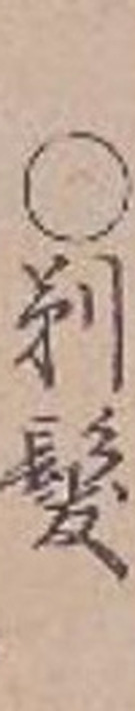〇剃髪
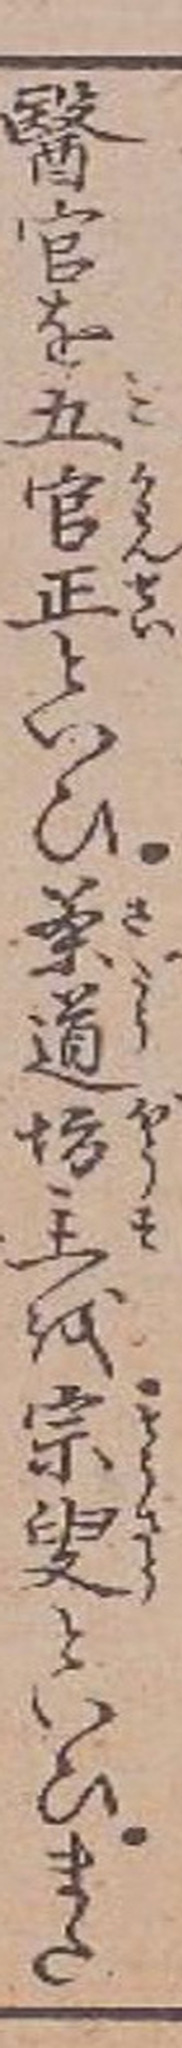医官を五官生といひ•茶道坊主を•宗叟といひ•また
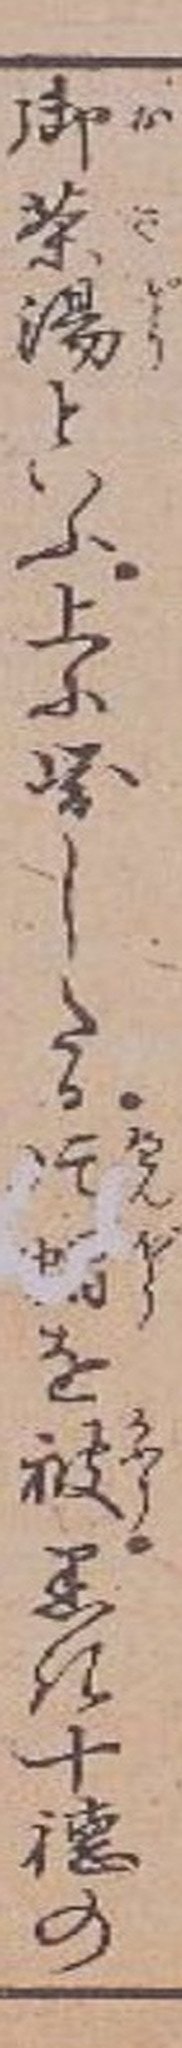御茶湯といふ•上に図したる•片帽を被•黒き十徳の
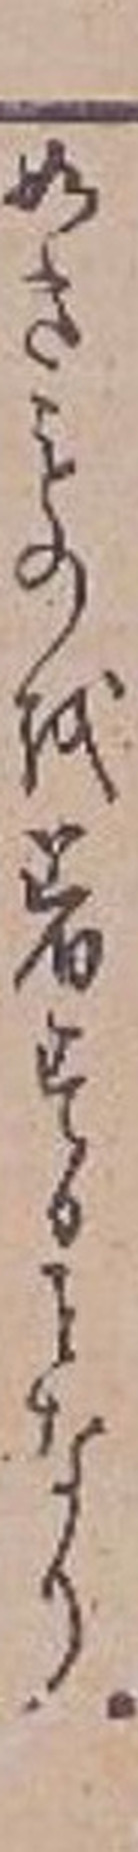如きものを着することなり•
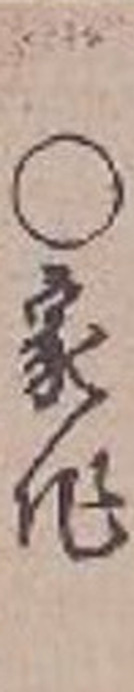〇家作
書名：琉球談
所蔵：University of the Ryukyus Library
